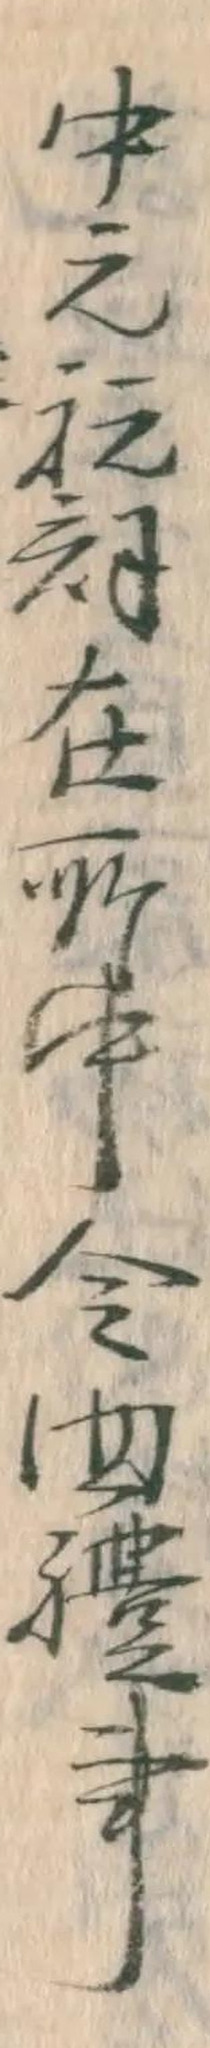中之祝詞在所中令回禮事
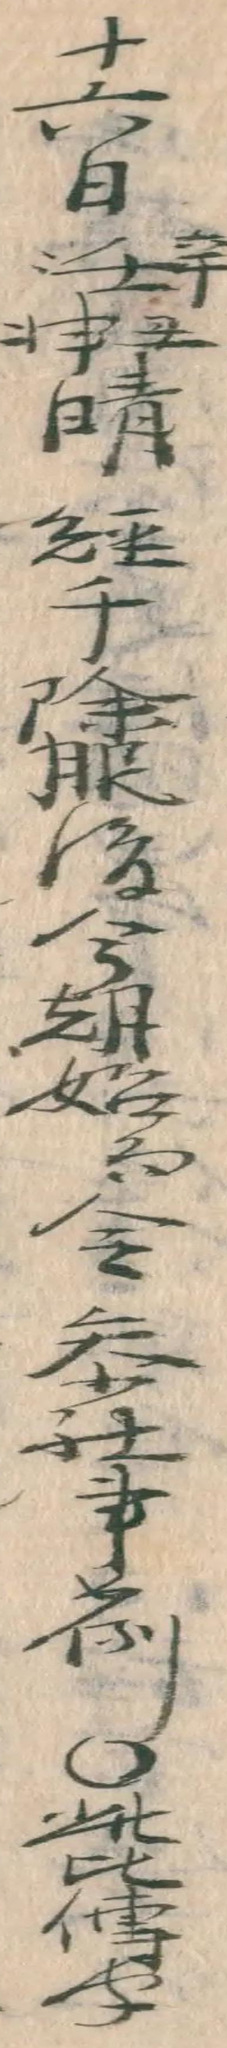十六日辛丑晴経千除服後今朝始而令参社事如例◯此比傳季
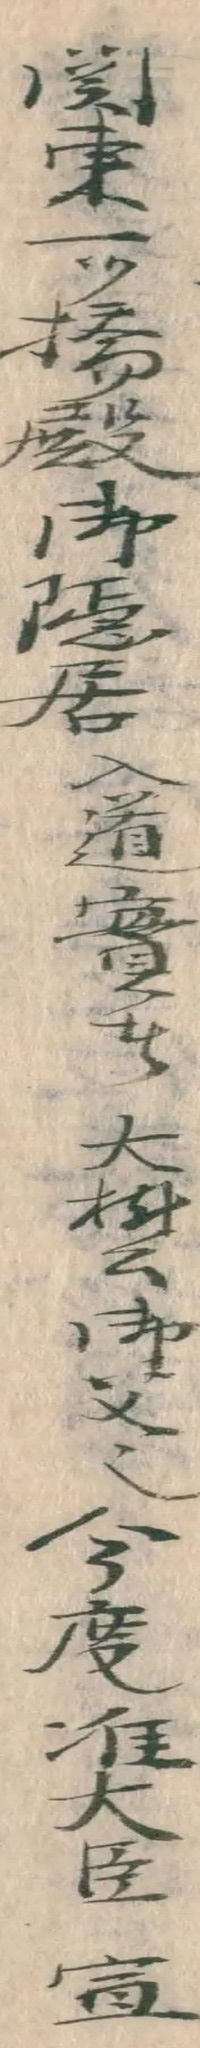関東一ツ橋殿御隠居入道實者大樹公御父也今度准大臣宣
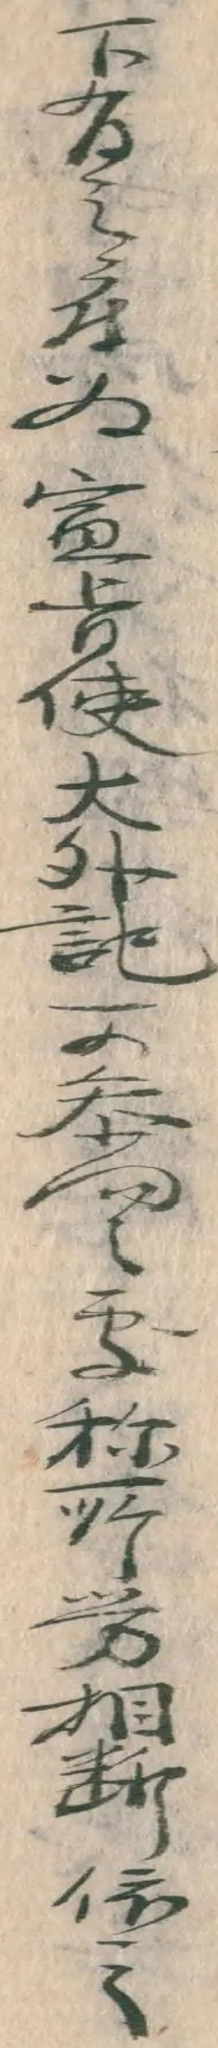下有之ニ付為宣旨使大外記可参向之處称所労相断依之
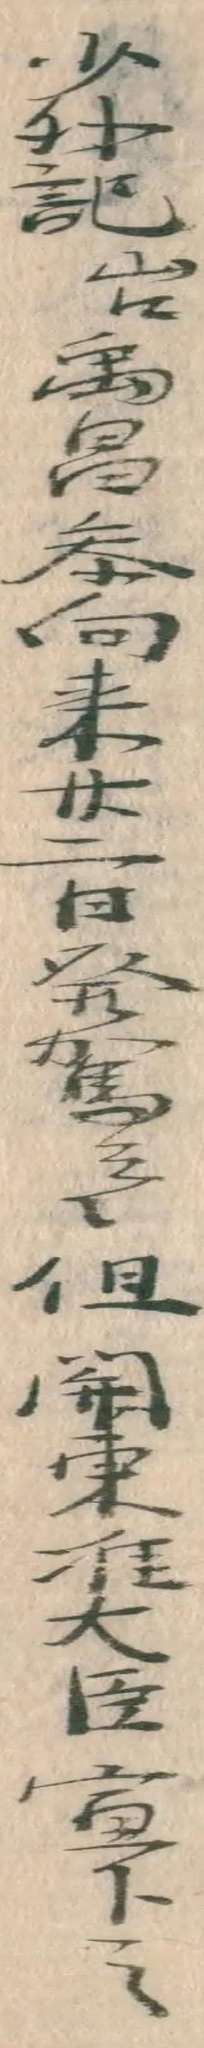少外記山口禹昌参向来廿二日発駕云〻但関東雅大臣宣下之
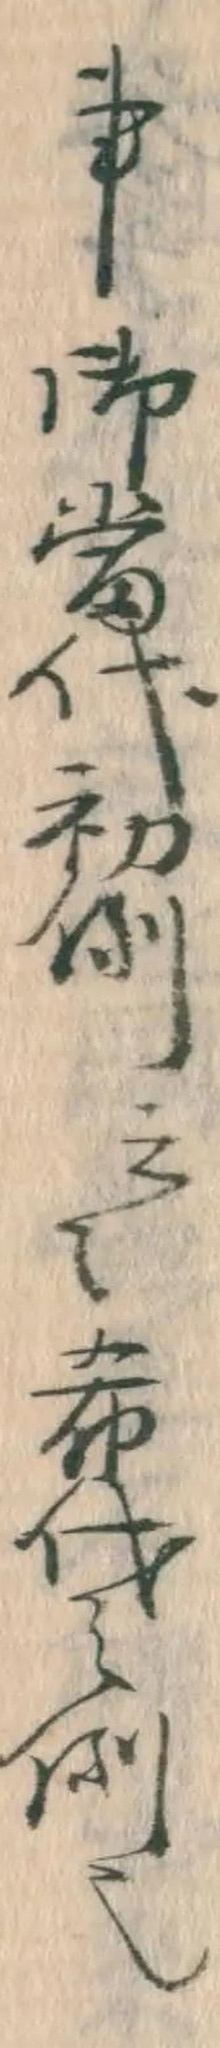事御當代初例云々希代之例也
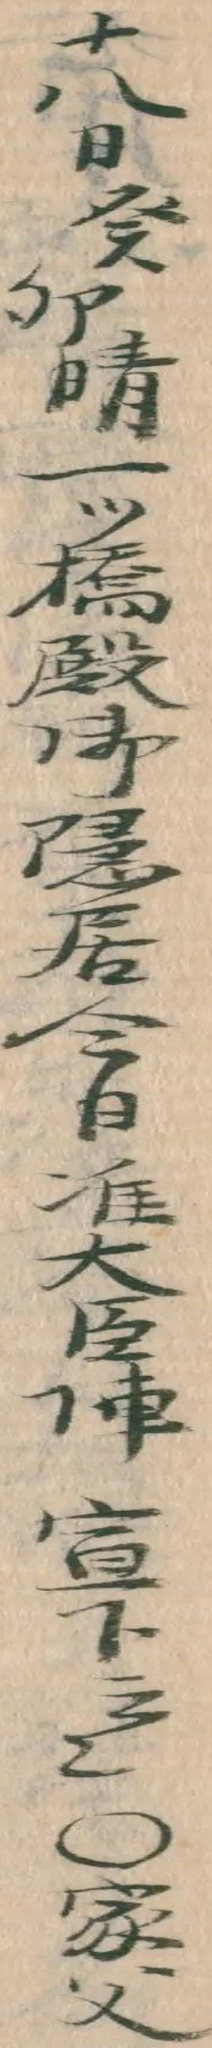十八日癸卯晴一ツ橋殿御隠居今日准大臣陣宣下云々〇家父
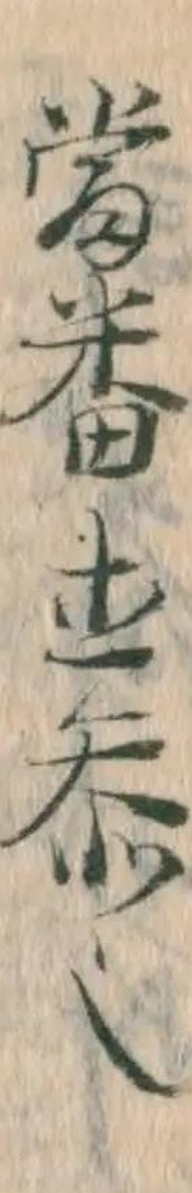當番直参也
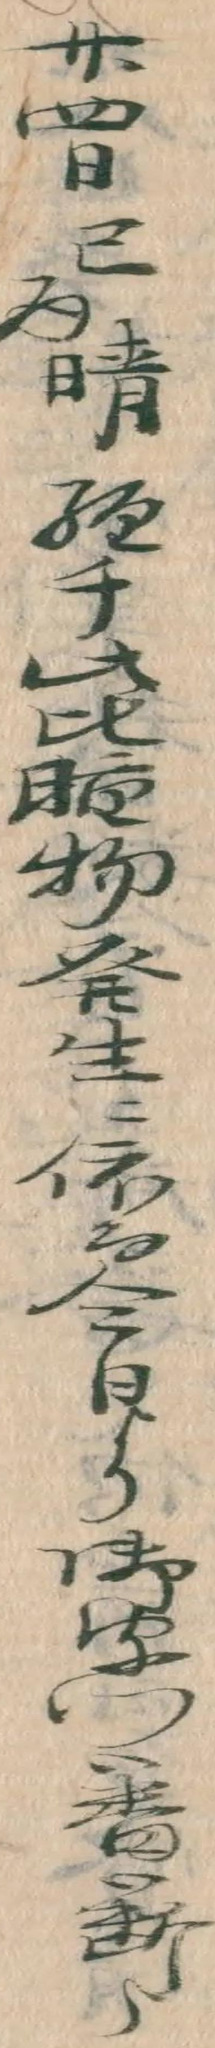廿四日己酉晴経千此比腫物発生二依而今日より御家門御番御断申
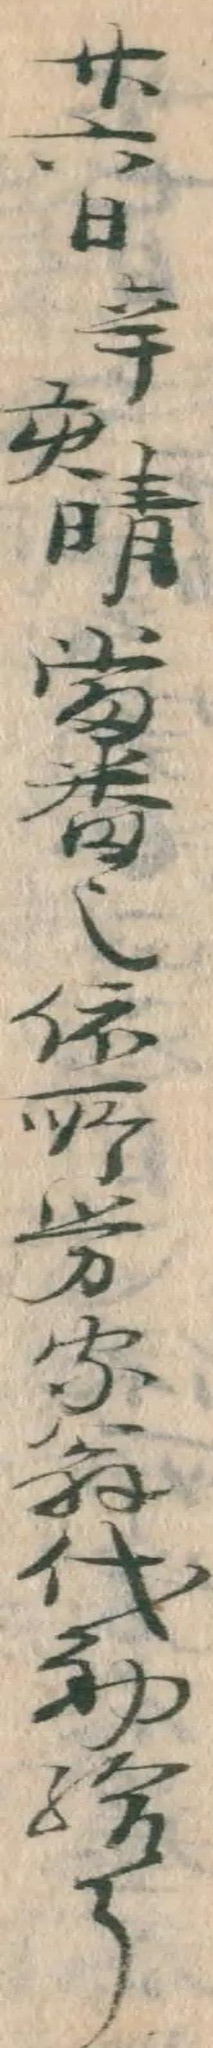廿六日辛亥晴當番也依所労家翁代勤給了
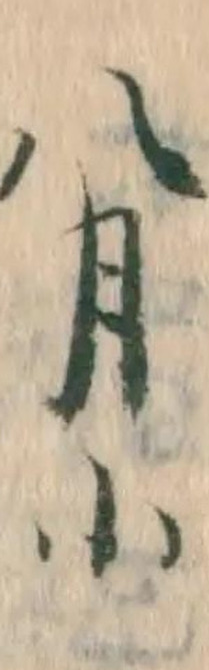八月小
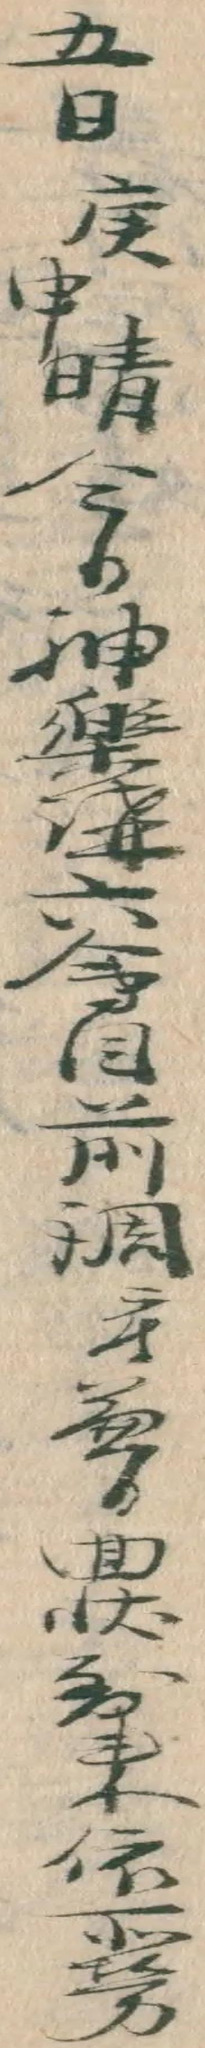五日庚申晴今日神楽講六會目前調ニ付兼而回状到来依所労
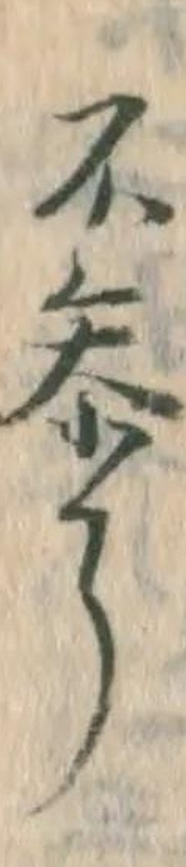不参了
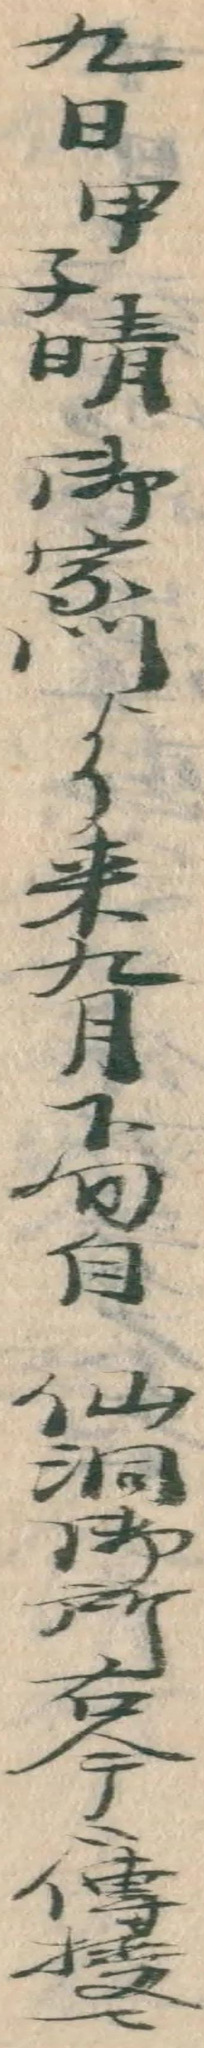九日甲子晴御家門より来九月下旬自仙洞御所古今御伝授可
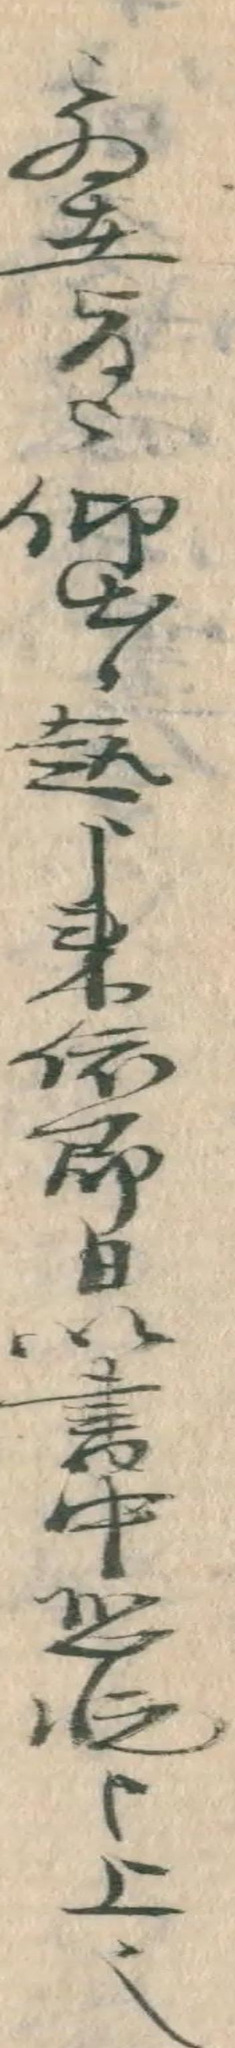被為在旨被仰出候趣申来候即日以書中恐悦申上也
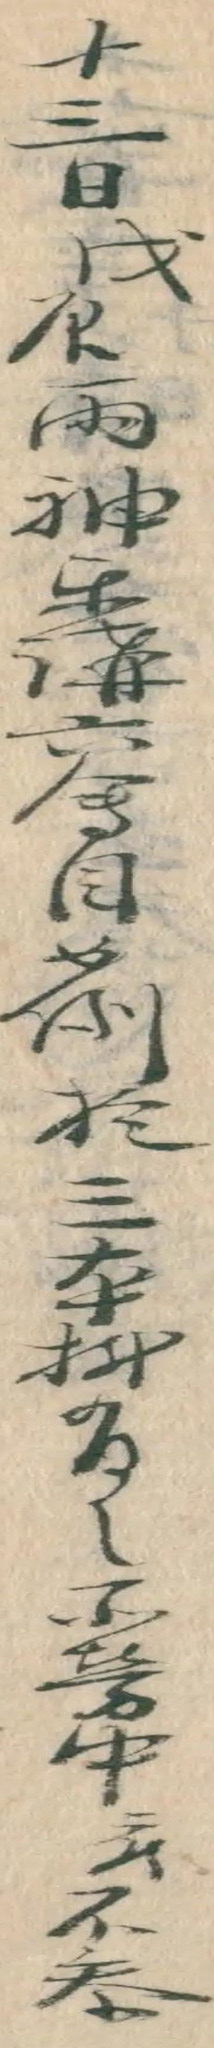十三日戊辰両神楽講六會目如例於三本掛有之所労中ニ付不参
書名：賀茂社記録. 第65冊
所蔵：国立国会図書館 National Diet Library, JAPAN
